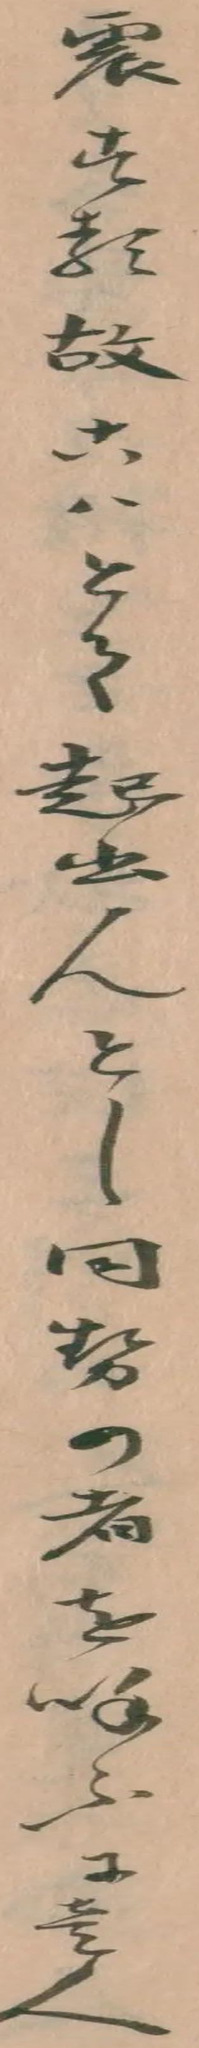震する故こハとて起出んとし同勢の者を呼ふに壱人
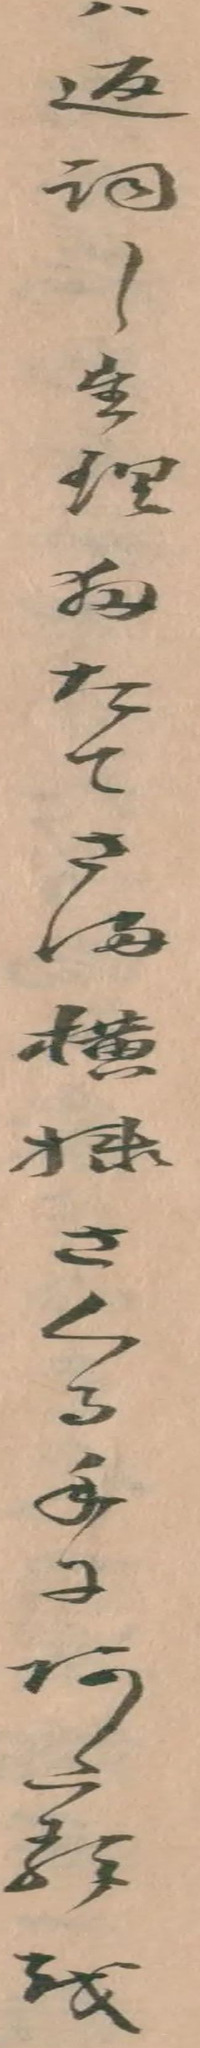ハ返詞したり扨たてさま横様さぐる手にあたるを
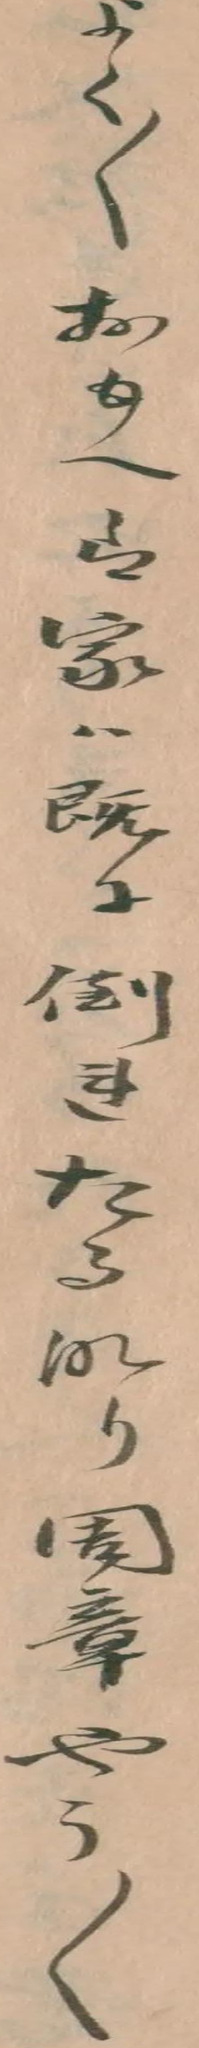よく〳〵思へは家ハ既に倒れたるなり周章やう〳〵
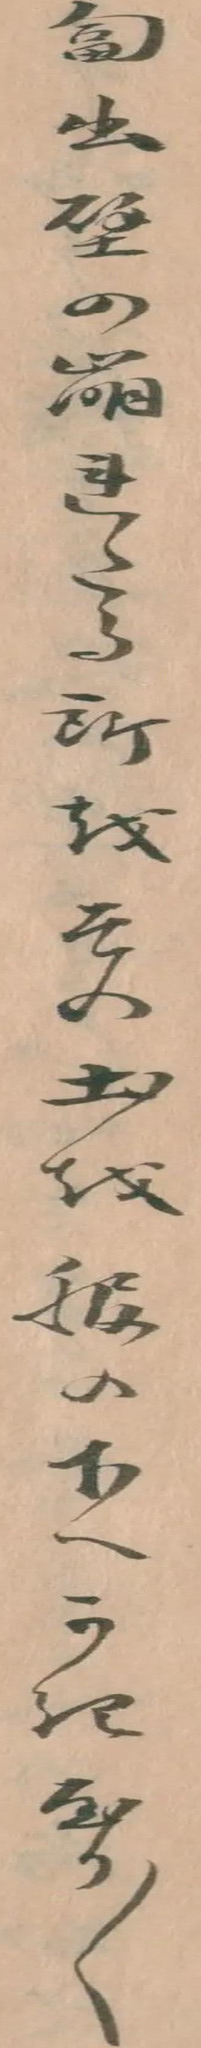匍出壁の崩れたる所をその土を腹の下へかきやり〳〵
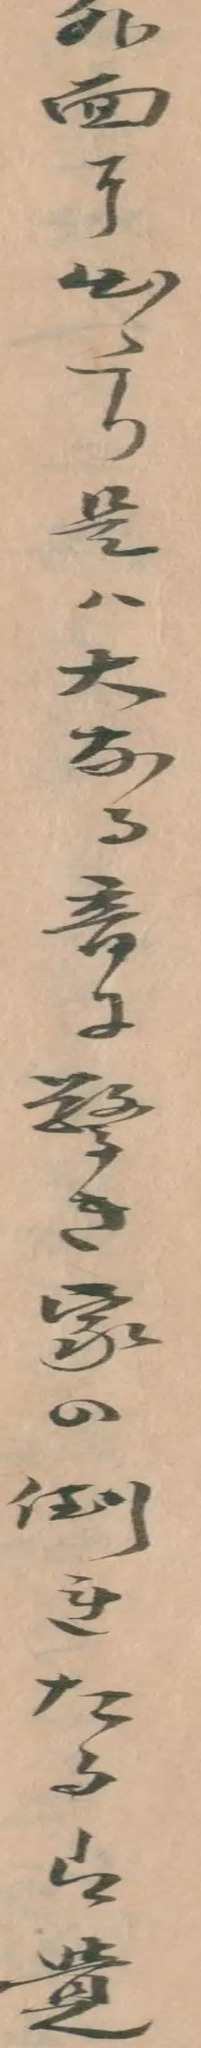外面に出たりこれハ大なる音に驚き家の倒れたるは覚

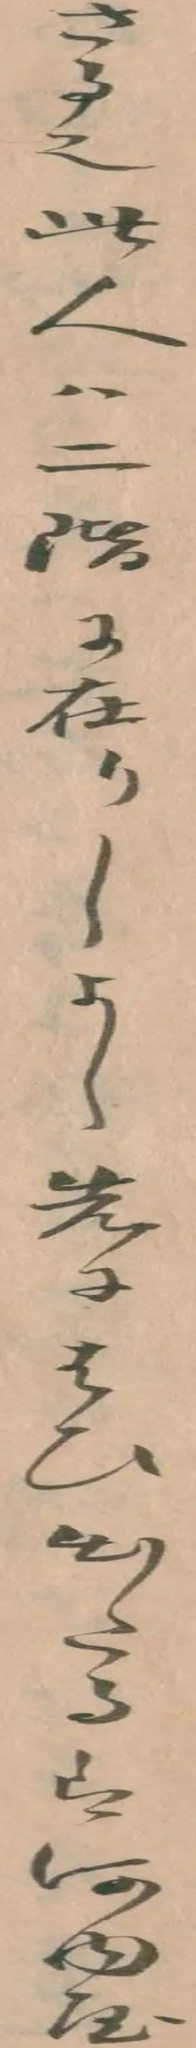みる也此人は二階に在りしよし先にはひ出たるは河内屋
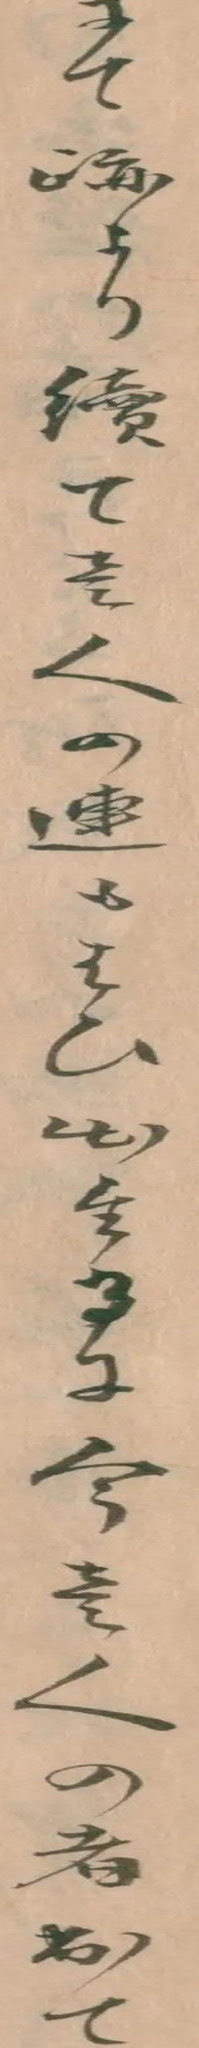にて跡より続て壱人の連もはひ出たるに今壱人の者出て
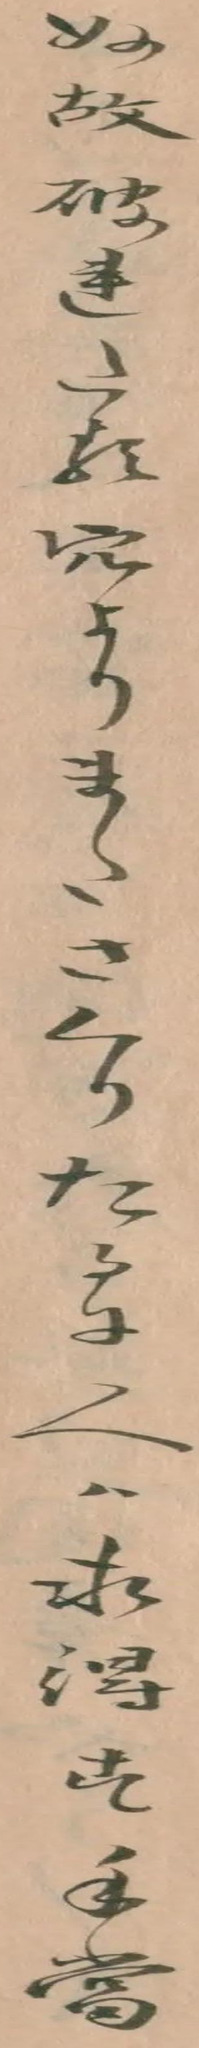ぬ故破れたる穴よりまたさくりたるに人は求得す手当
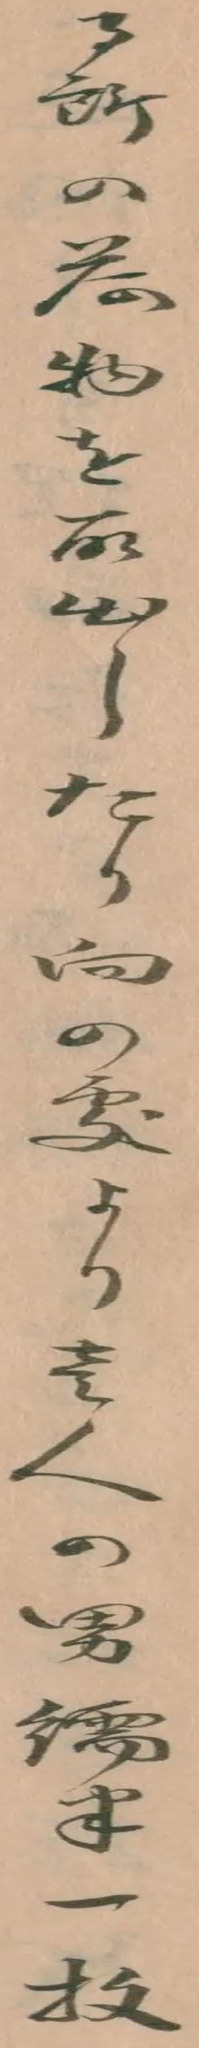る所の荷物を取出したる向の処より壱人の男襦袢一枚
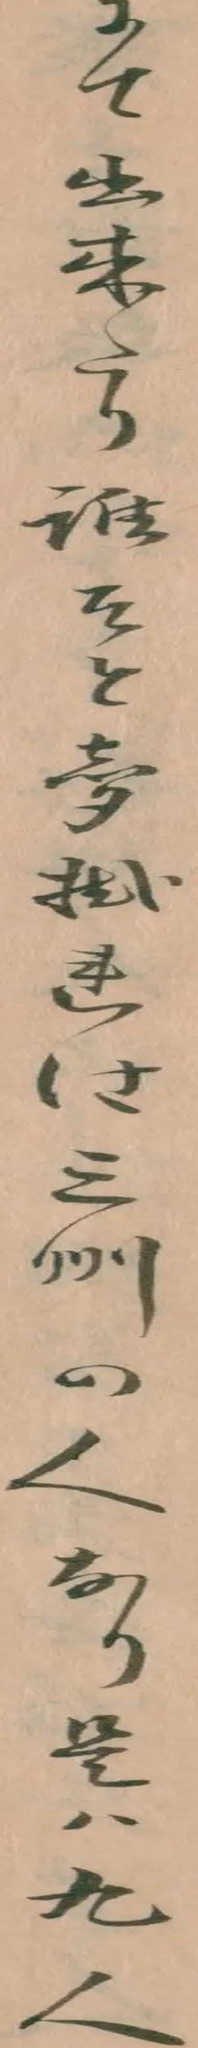にて出来たり誰そと声を掛れは三州の人なり是ハ九人
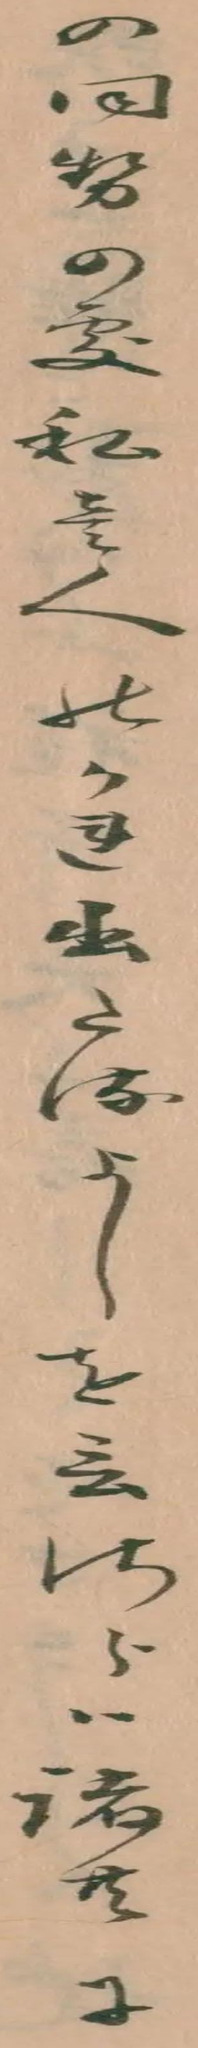の同勢の処私壱人のかれ出たるよしを云さらハ諸共に
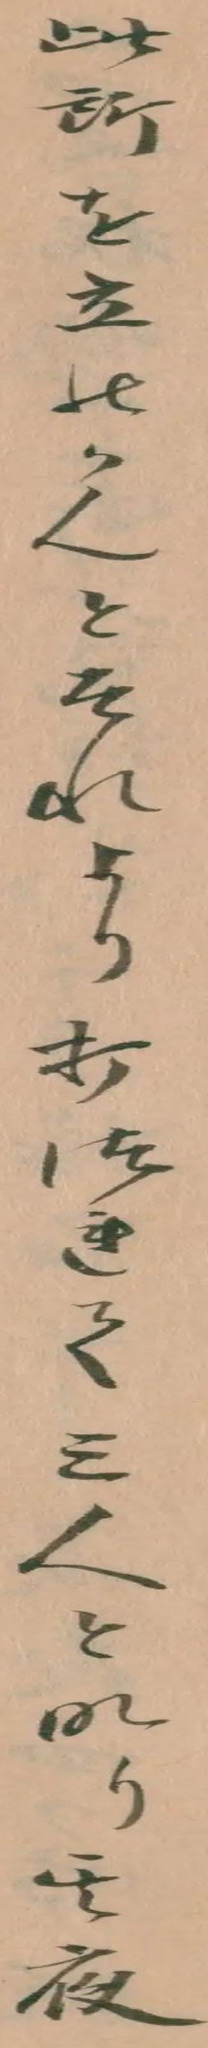此所を立のかんとそれより打つれて三人となり其夜
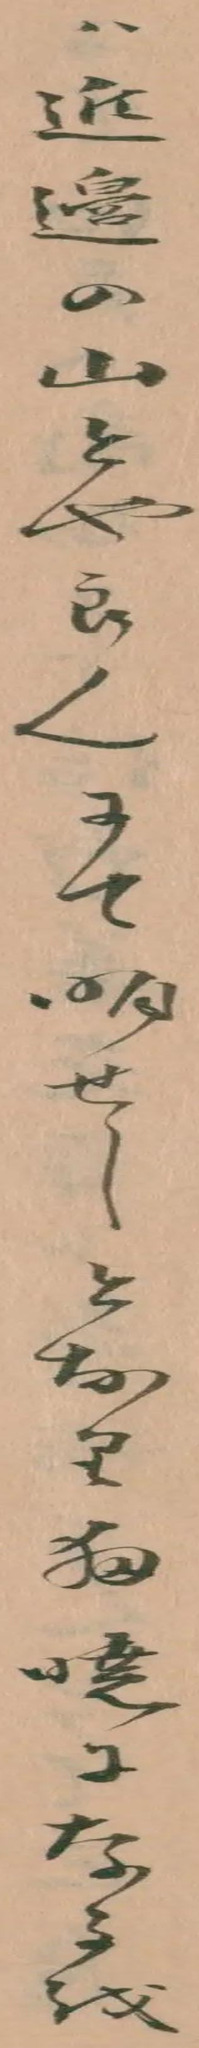ハ近辺の山とやらんまで明せしとなり猶暁になるを
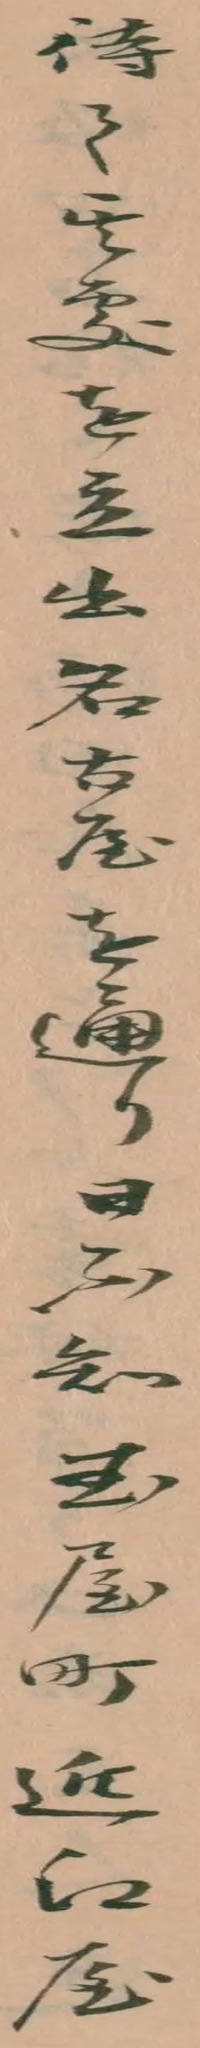待て其処を立出名古屋を通り日ふち玉屋町近江屋
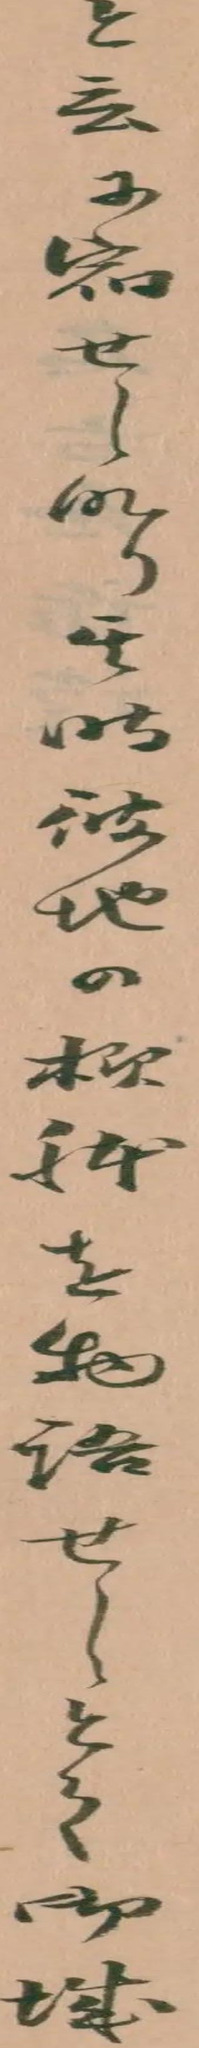と云に宿せしなり其時彼地の様体を物語せしとて御城
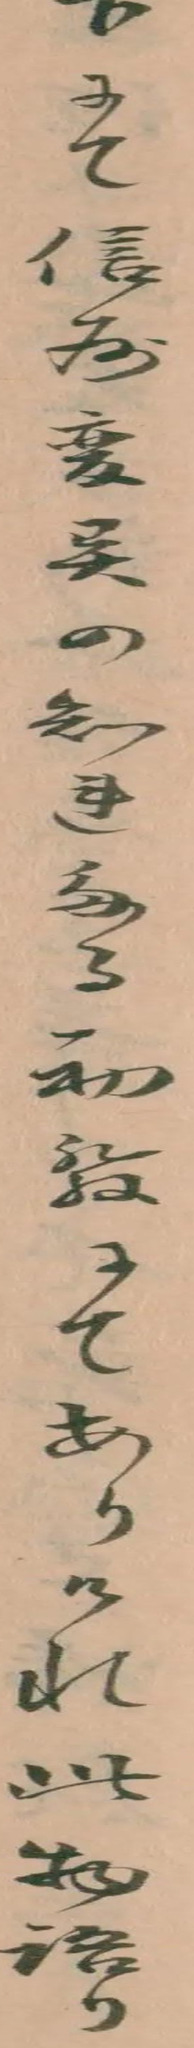下にて信州変異の知れたる初発にてありけれ此物語り
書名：地災撮要. 巻3(地震之部)-巻4(噴火之部)
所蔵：国立国会図書館 National Diet Library, JAPAN
